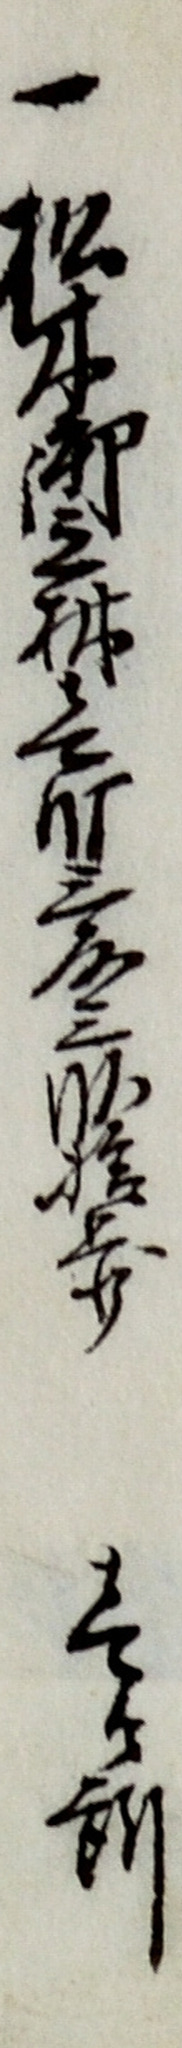一松木御立林壱町三反三畝拾歩壱ヶ所
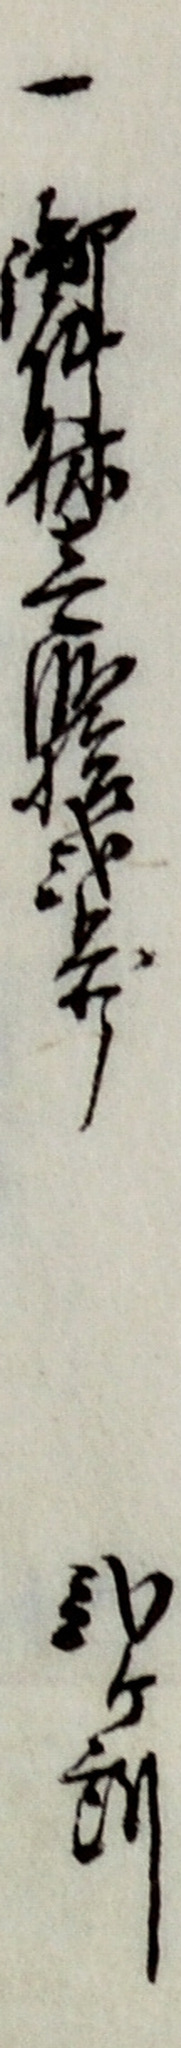一御竹林壱畝拾弐歩弐ヶ所
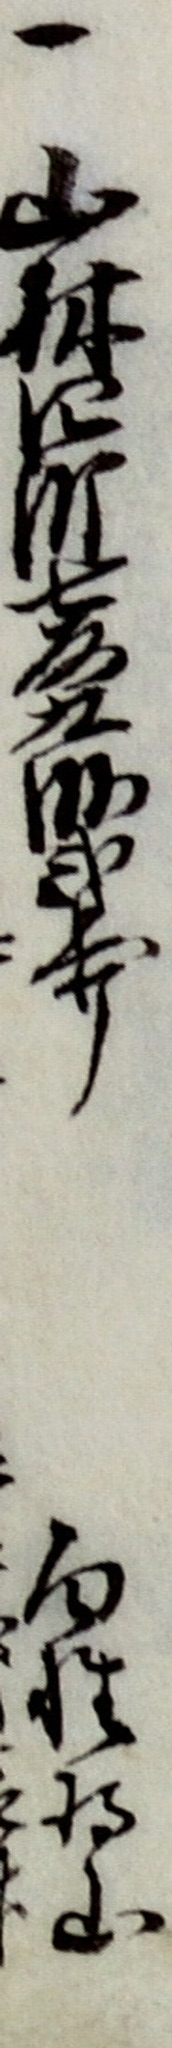一山林四町七反九畝弐歩百姓持山

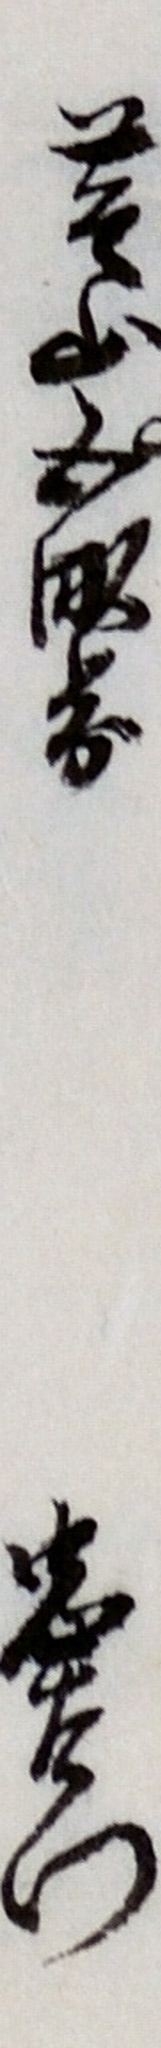芝山五畝歩忠右衛門
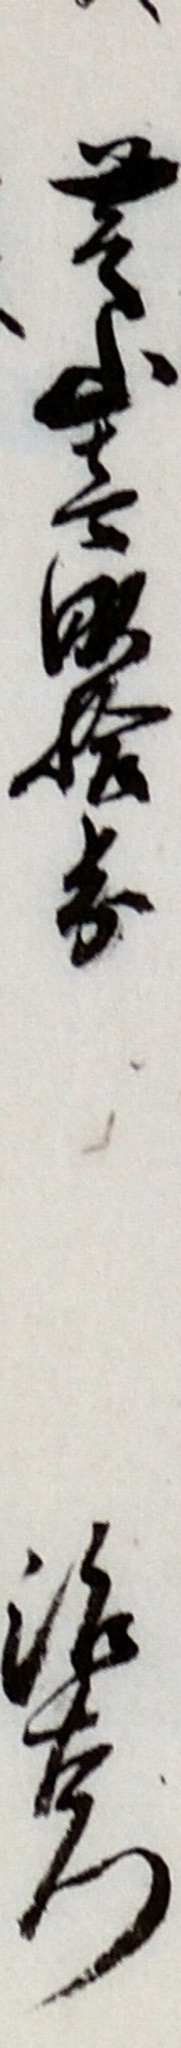芝山壱畝拾歩治右衛門
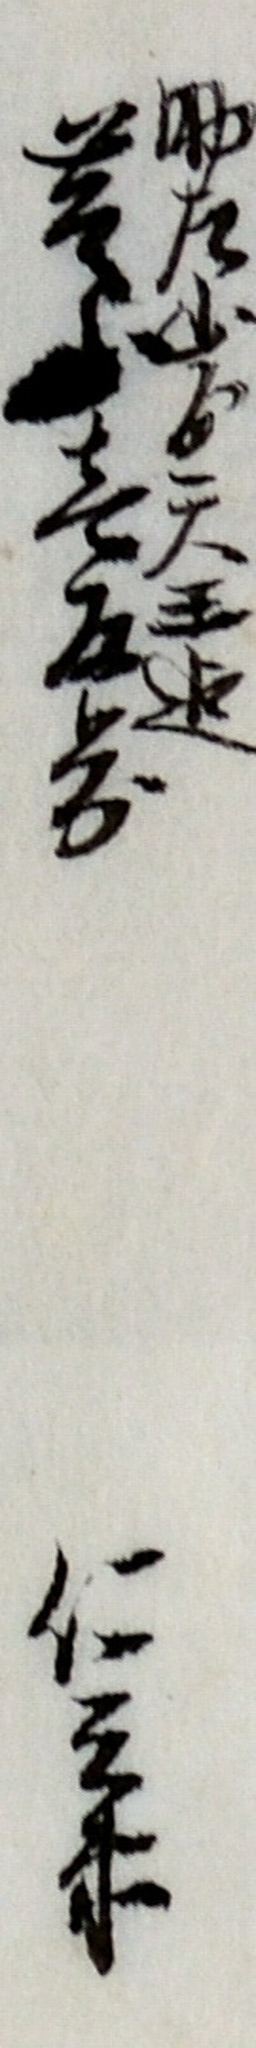芝山壱反歩仁兵衛

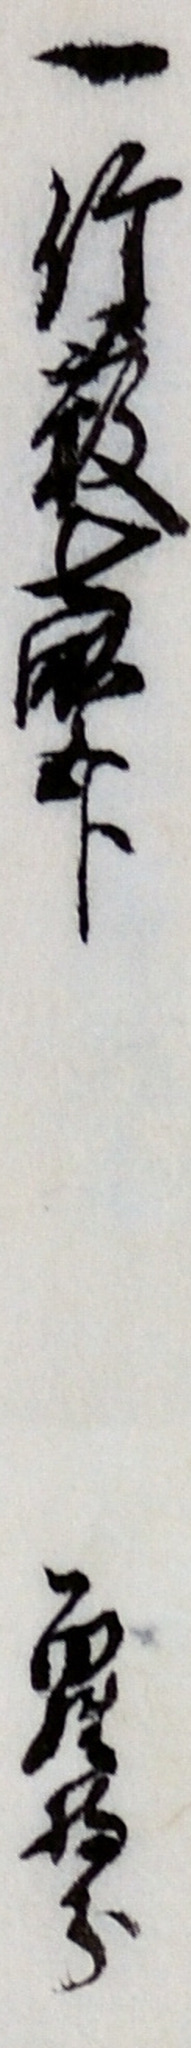一竹藪七畝五歩百姓持分
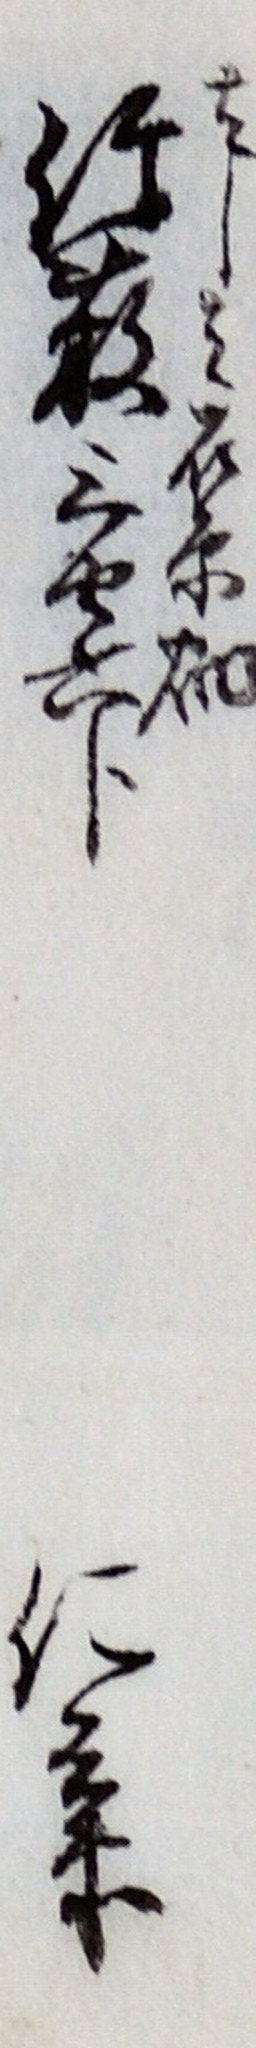竹藪三セ六歩仁兵衛
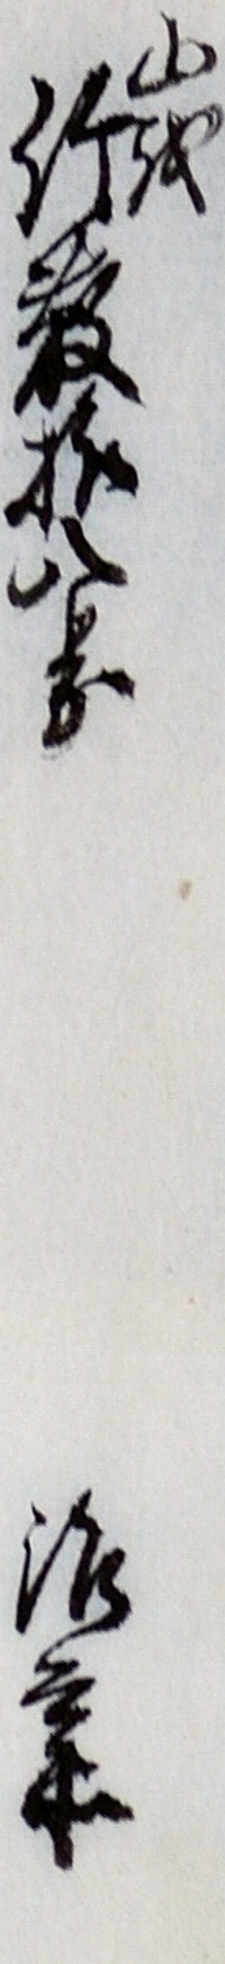竹藪拾八歩治兵衛
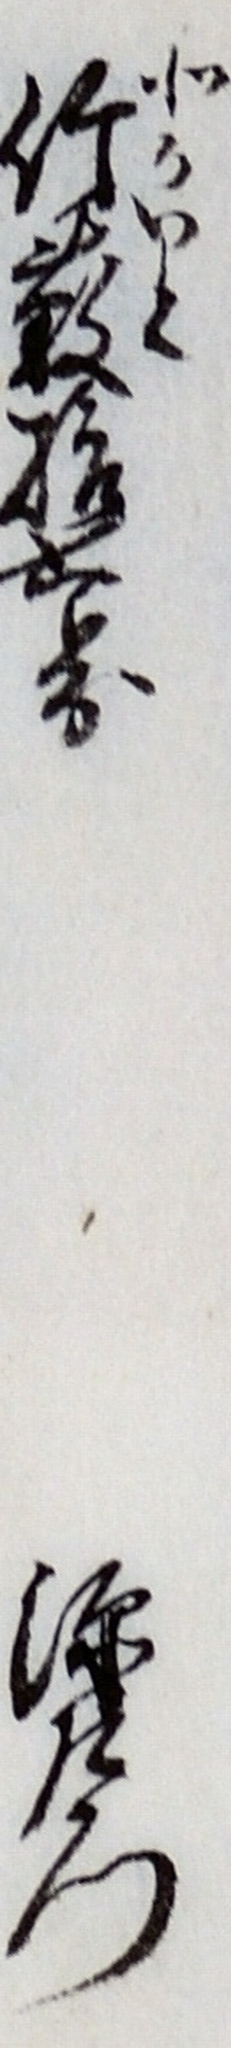竹藪拾六歩源左衛門
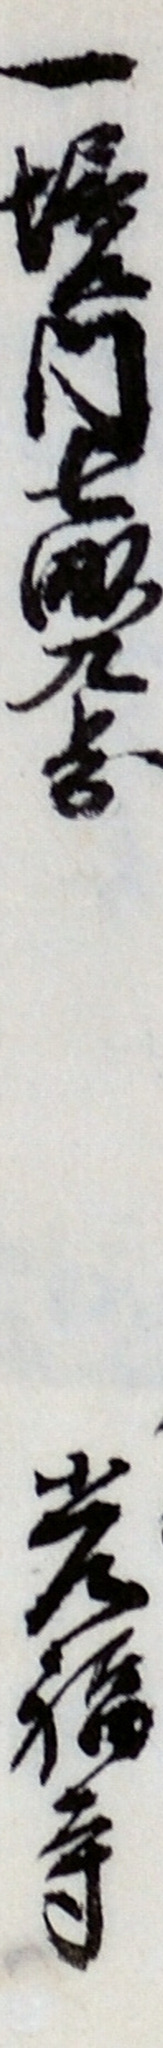一境内七畝九歩光福寺
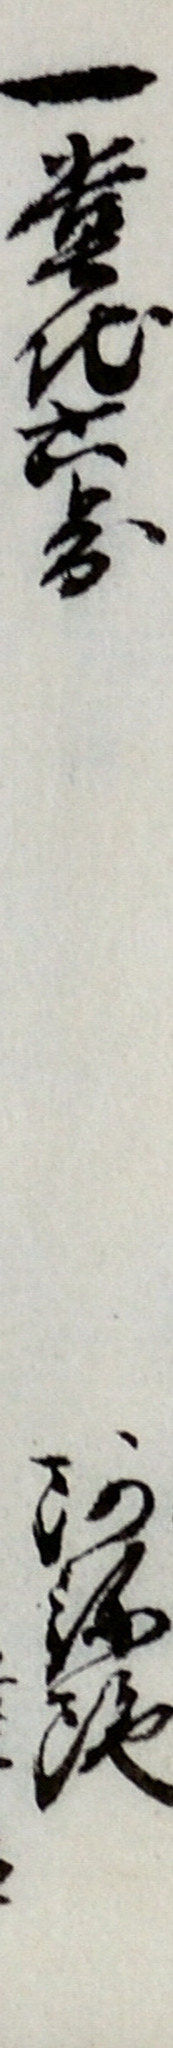一堂地六歩阿弥陀
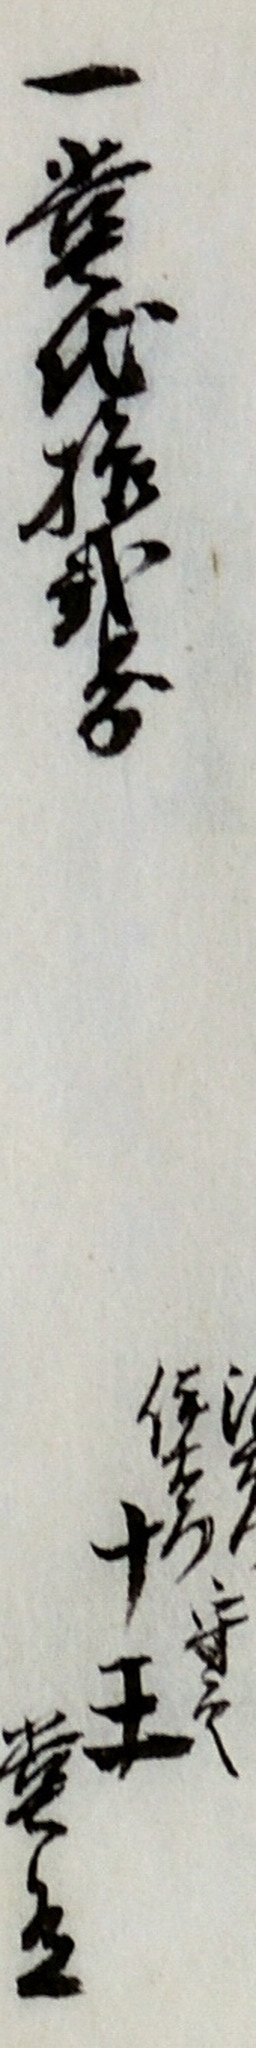一堂地拾弐歩地蔵
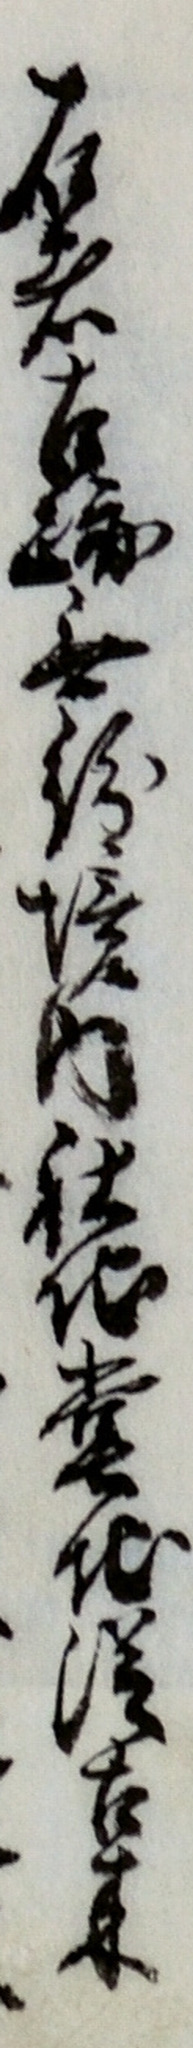右者古跡無粉境内社地堂地従古来
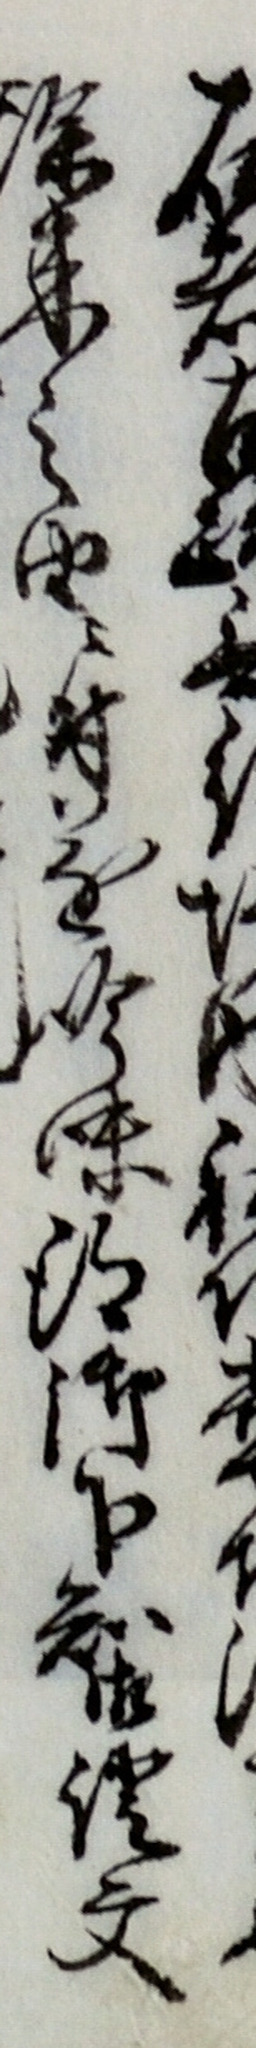除来之由ニ付進吟味得御下知御証文
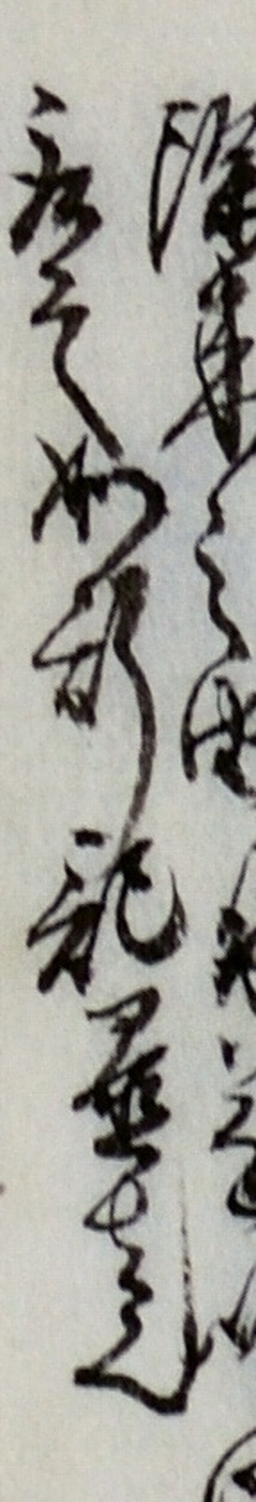取之如斯記置者也
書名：御領分中山林社地手控
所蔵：伊那市立高遠町図書館・合同会社AMANE
